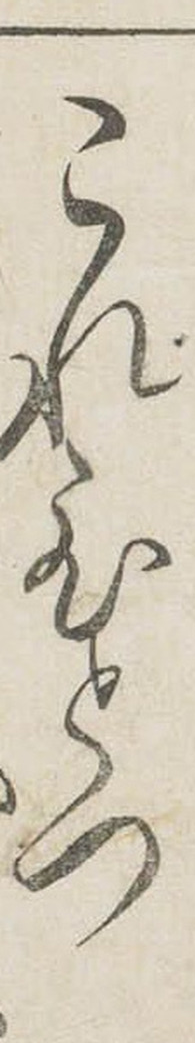これひとつ
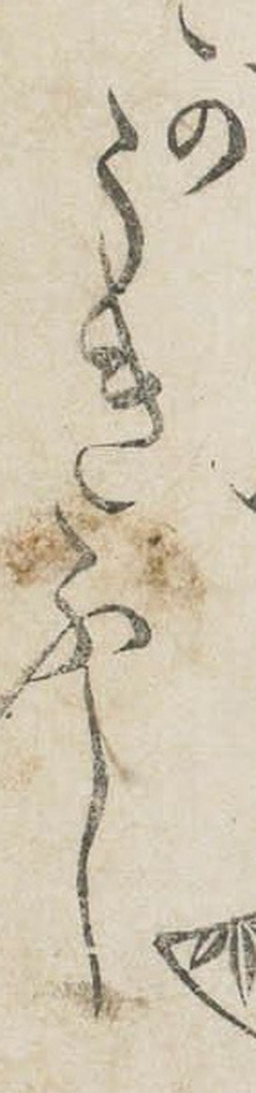うきふし

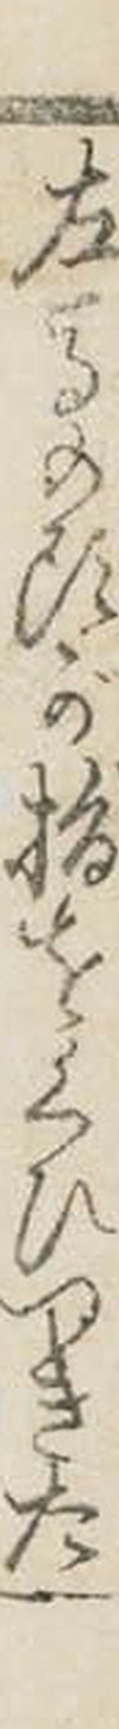左馬の頭が指をくひつきた
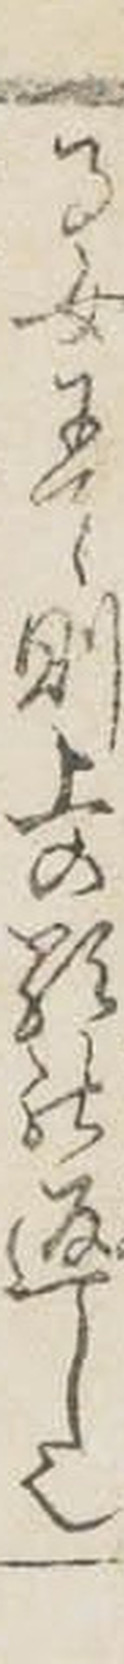る女にて則上の歌の返し也
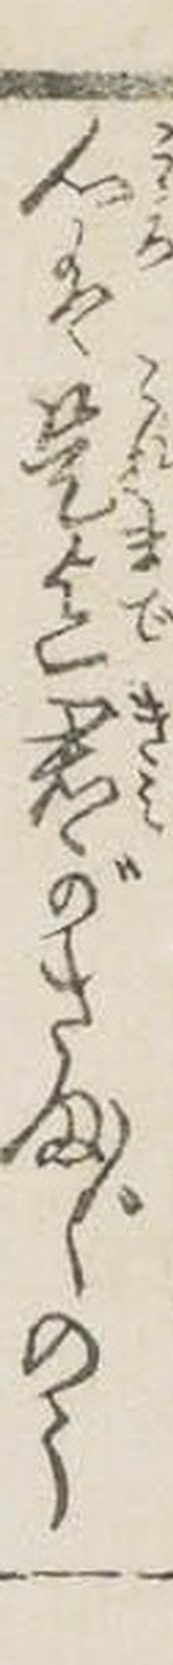心は是迄君がさま〴〵のう
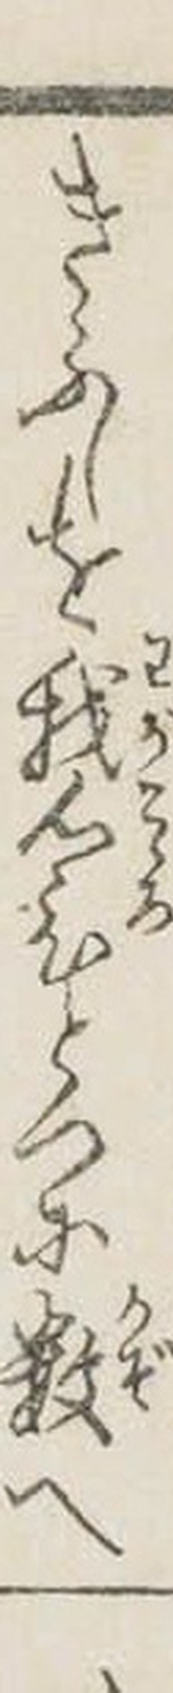きふしを我心ひとつに数へ
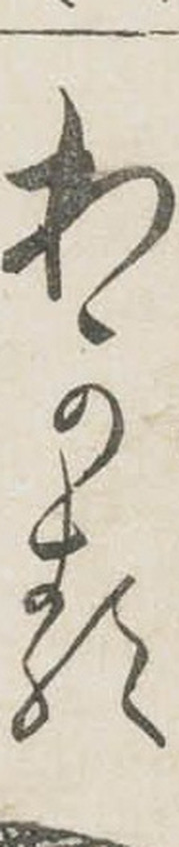わかる
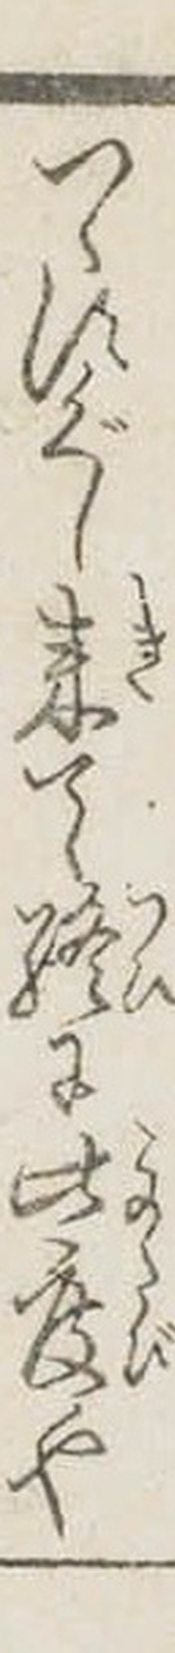つゝすぐし来て終に此度や
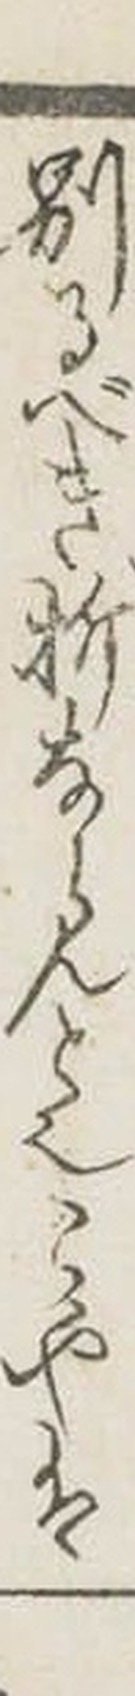別るべき折ならんと也こやは
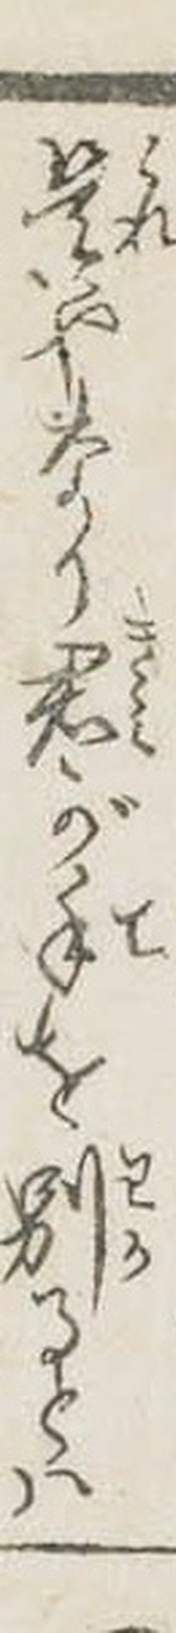是やなり君が手を別るとは
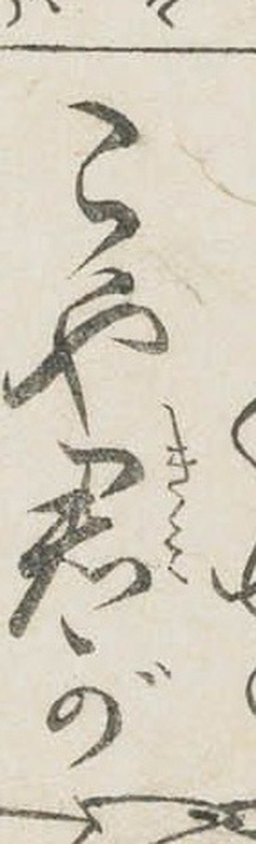こや君が
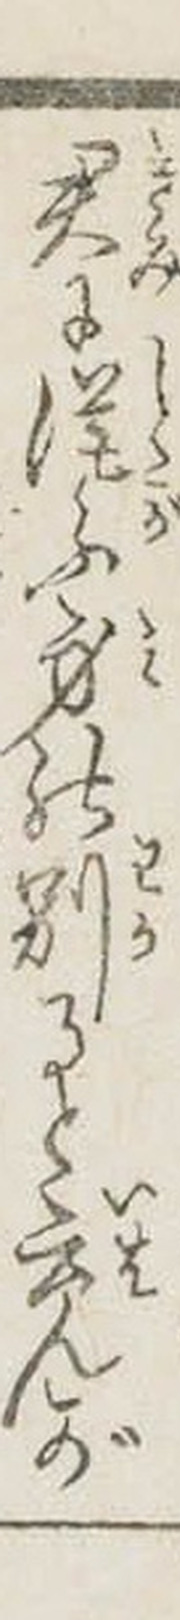君に従ふ身の別ると云んが
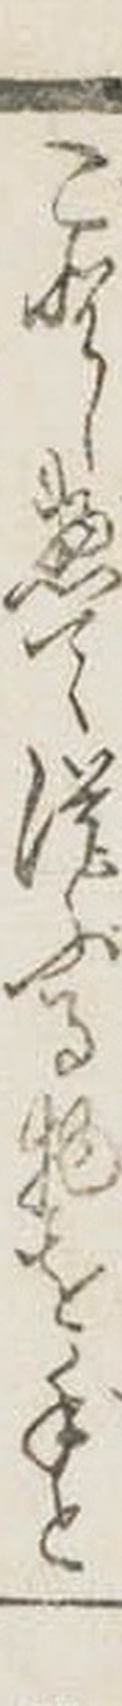ごとし総て従ふる物を手と
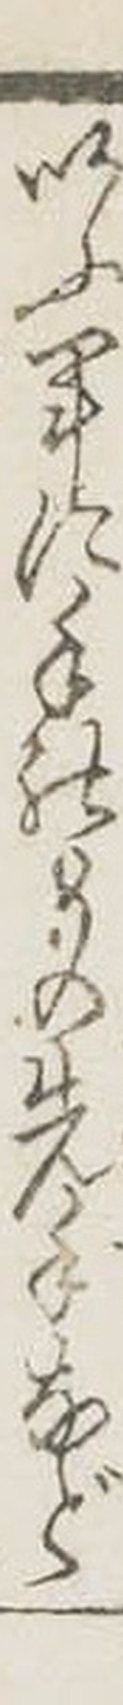いふ軍に手のもの先手など
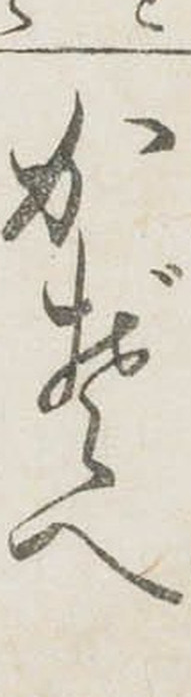かぞへ
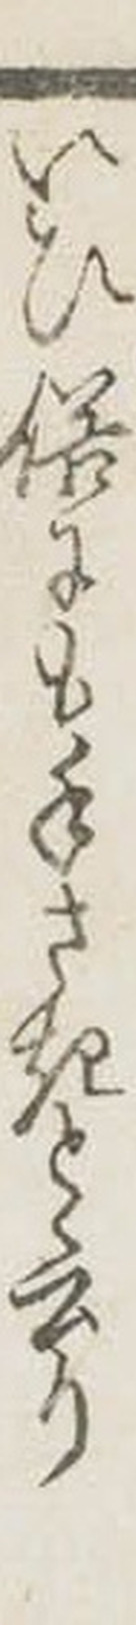いひ俗にも手さきと云り
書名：源氏百人一首
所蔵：東京学芸大学教育コンテンツアーカイブ
